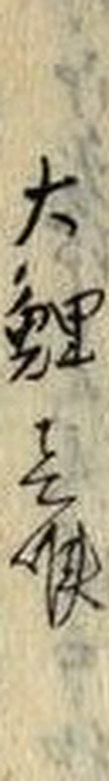大鯉壱喉
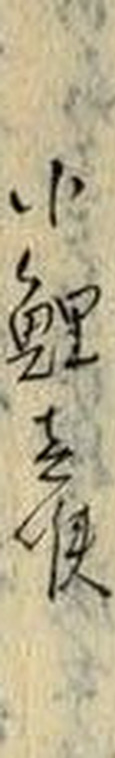小鯉壱喉
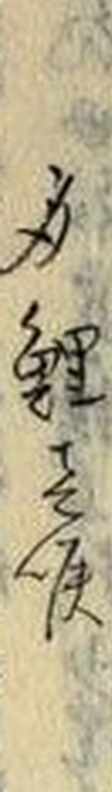大鯉壱喉
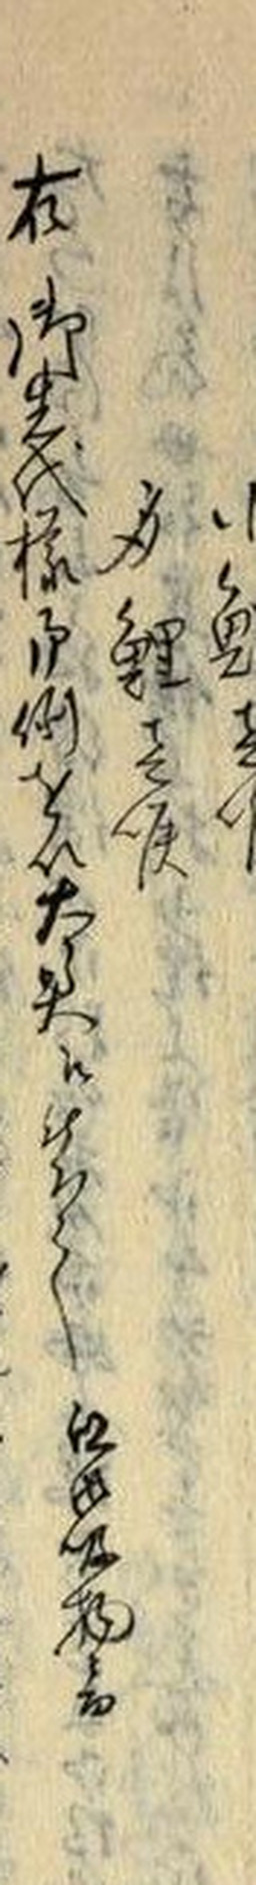右御先代様御例を以大奥江被下之但御吸物ニ而
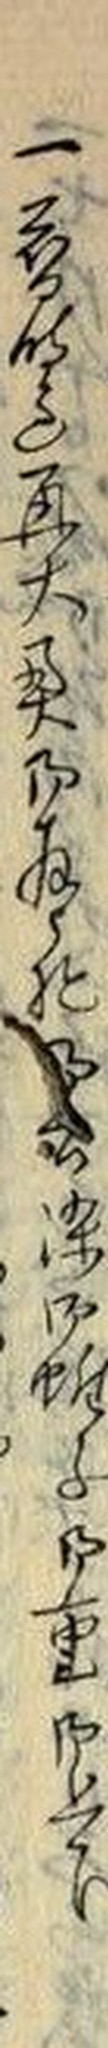一暮時過再大奥御拝被遊御召染御帷子御重御上下
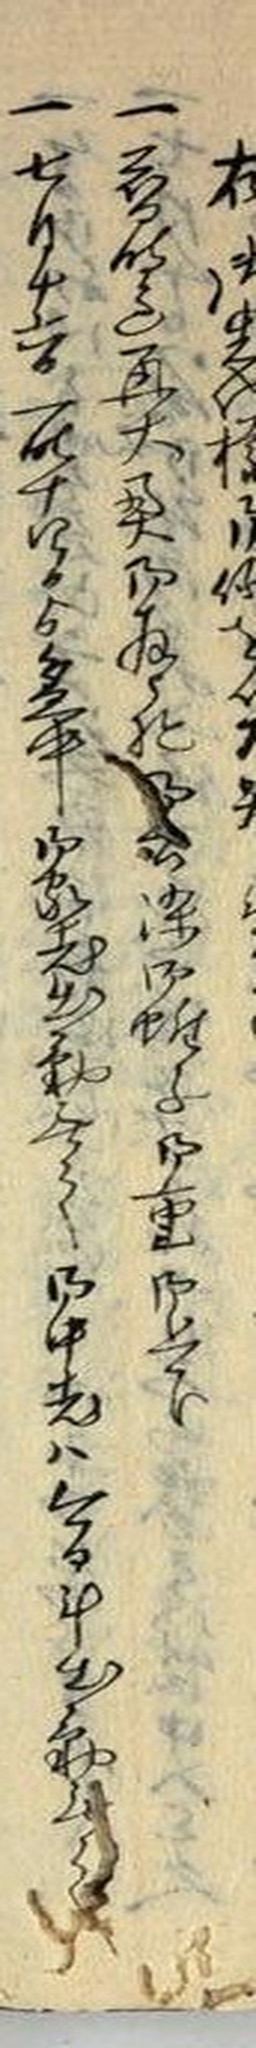一七月十六日一昨十四日ゟ盆中御家老出勤無之御中老ハ今日斗出勤無之
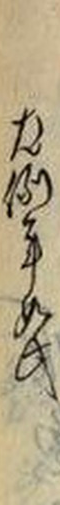尤例年如此
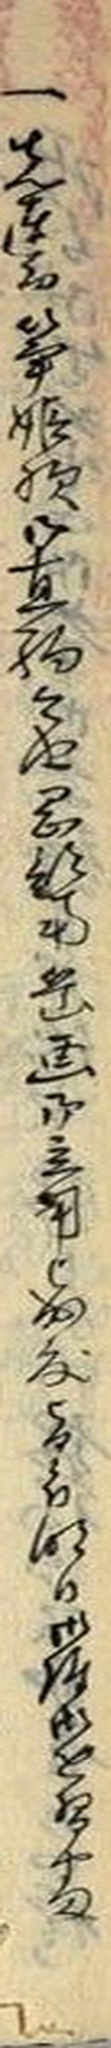一先達而箏姫様御直約之由岡部南岳画御立用被成度旨ニ付明日御附御近習番
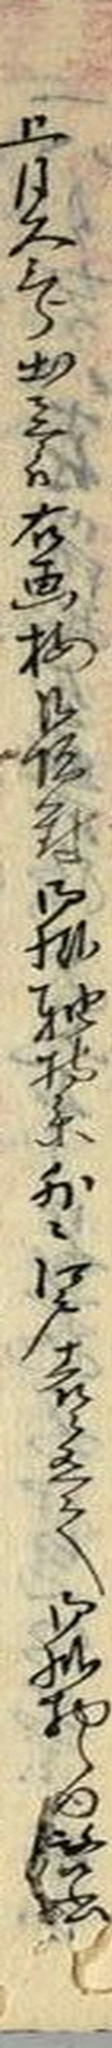上月久三郎出立ニ付右画梅弐幅対御掛軸持参外ニ江戸表ニ有之御掛物之内啓書
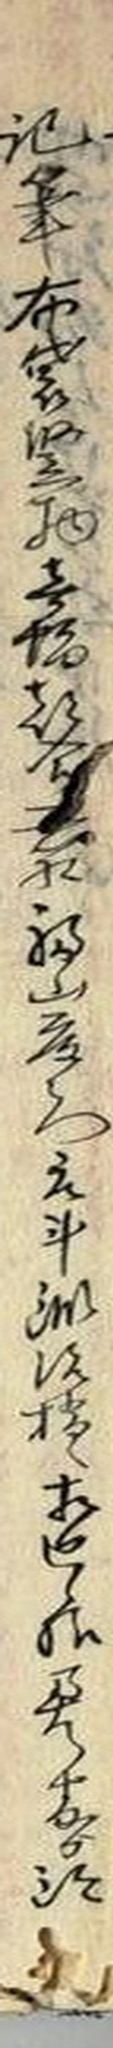記筆布袋竪物壱幅都合二箱福山藤右衛門取計鍛冶橋へ相廻候様奥之番ゟ鈴
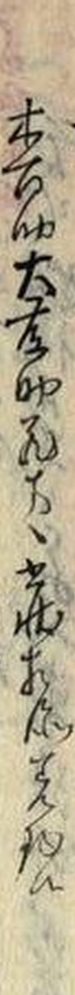木百助大藤助蔵方へ書状相添差越候
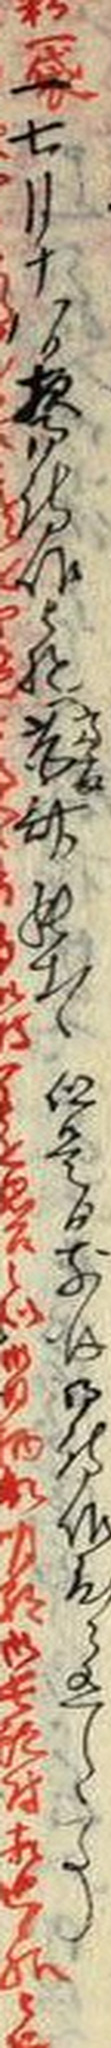一七月十八日夜御詩作被遊当番恭斉罷出候但是ゟ前後御詩作度々有之候事
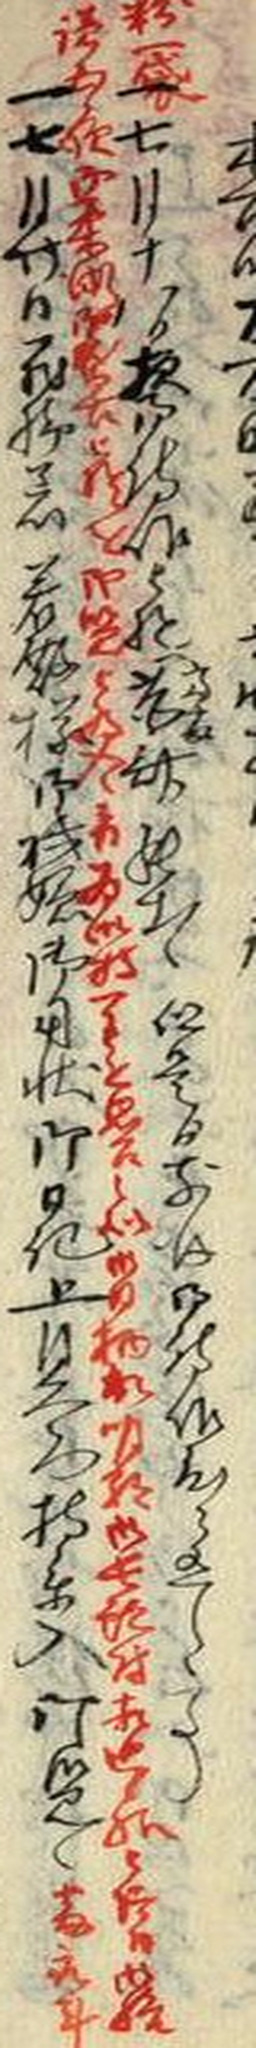一七月廿日飛脚着若殿様御機嫌御用状御日記上月久右衛門持参入御覧候
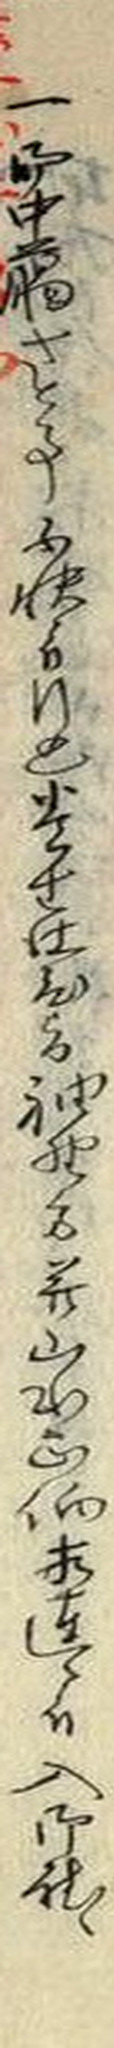一御中臈さと事不快ニ付引込養生仕度旨袖野方幷山本正伯相達候ニ付入御聴候
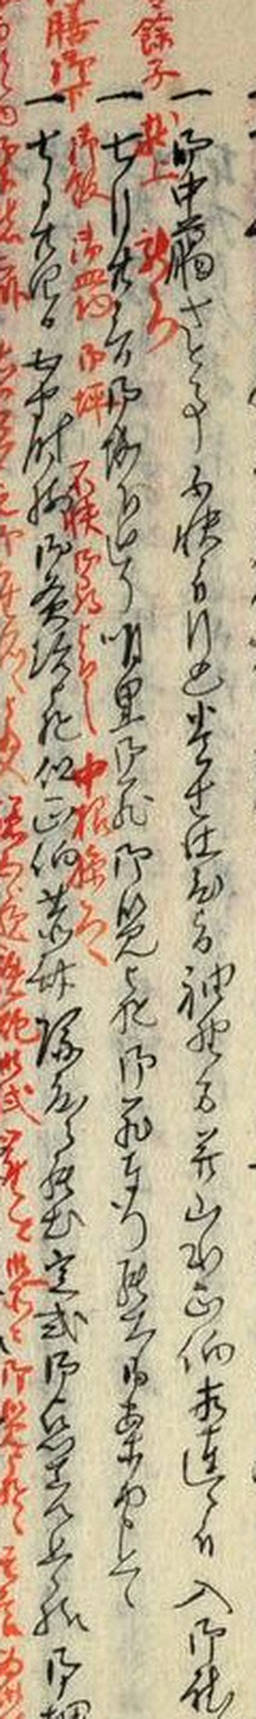一七月廿三日御城下廻り明里御蔵御覧被遊御蔵奉行罷出御案内申上候
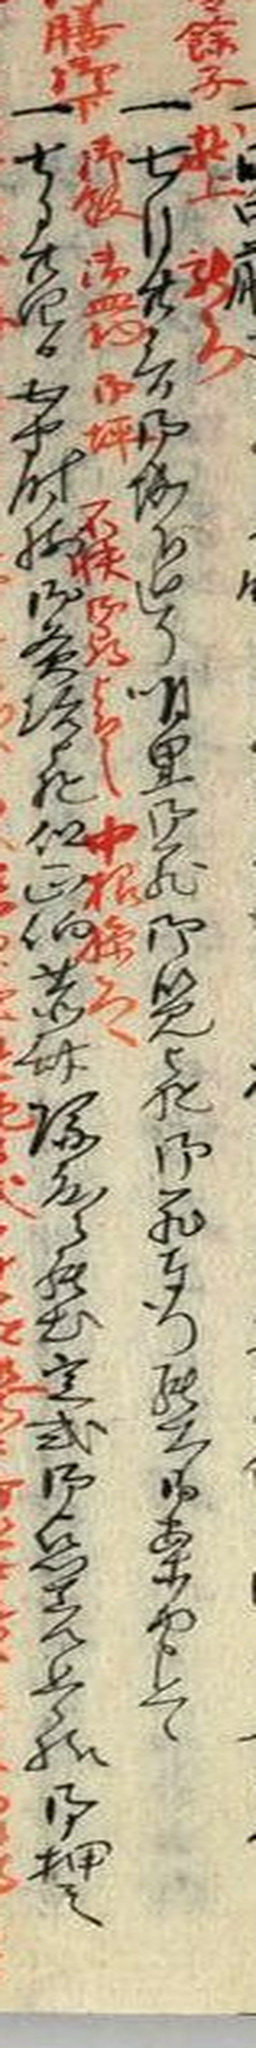一七月廿四日五半時揃御灸治被遊但正伯恭斎儀度々罷出定式御点差上候様御押之
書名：少傅日録抄（斉承付側向頭取日記、在国）
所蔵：福井県文書館 Fukui Prefectural Archives
